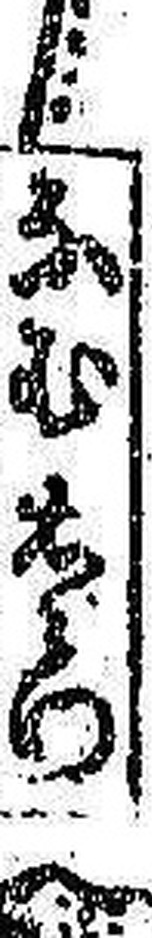なむ右衛門
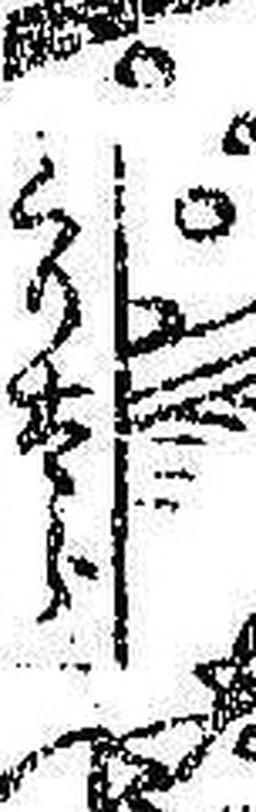くり太郎

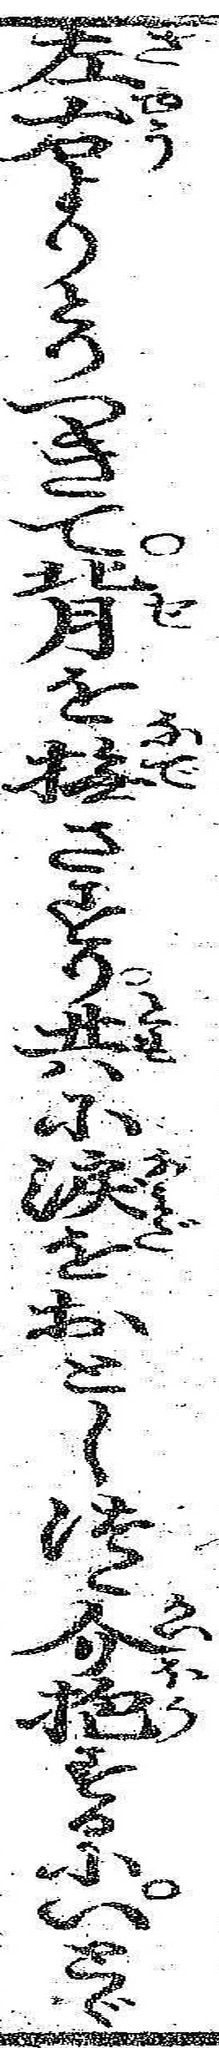左右よりとりつきて。背を撫さすり。共に涙をおとしつゝ介抱するに。いとゞ
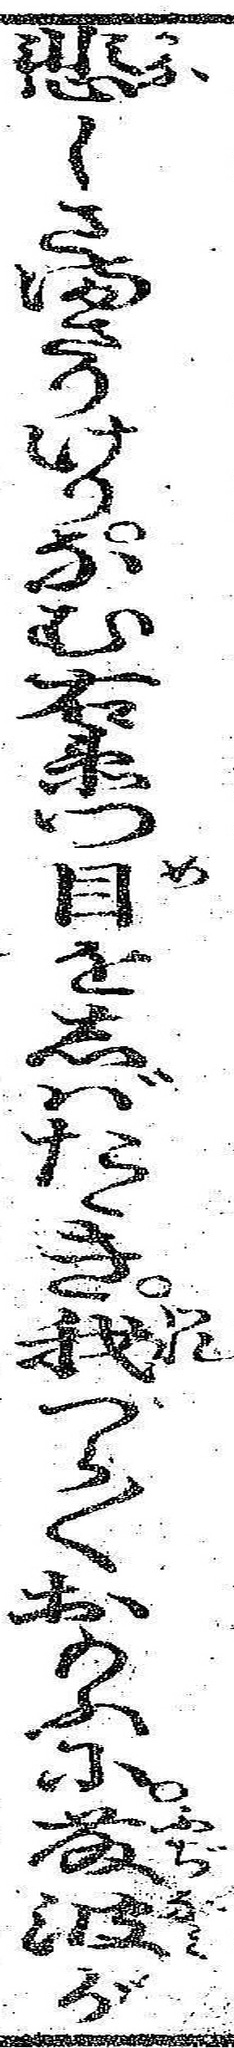悲しさまさりけり。なむ右衛門目をしばたゝき。我つら〳〵おもふに。藤波が
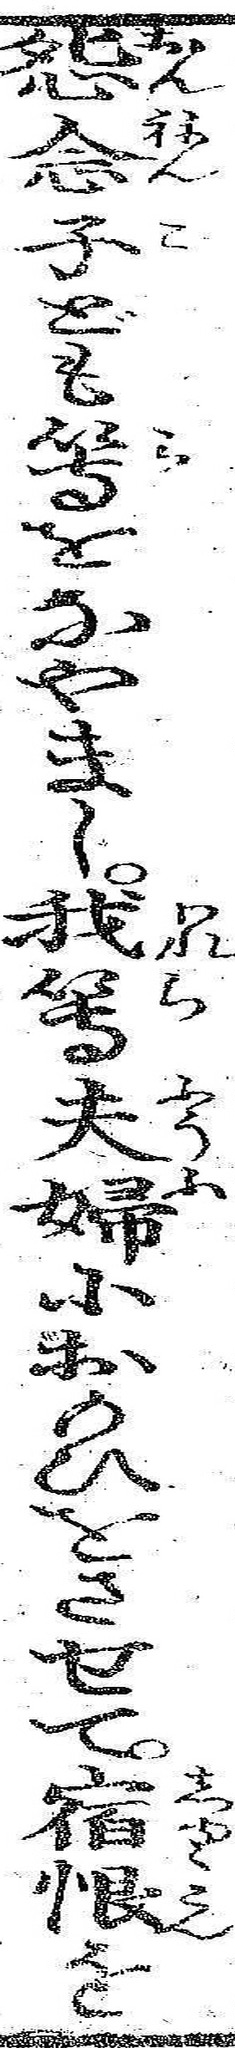怨念子ども等をなやまし。我等夫婦におもひをさせて。宿恨を
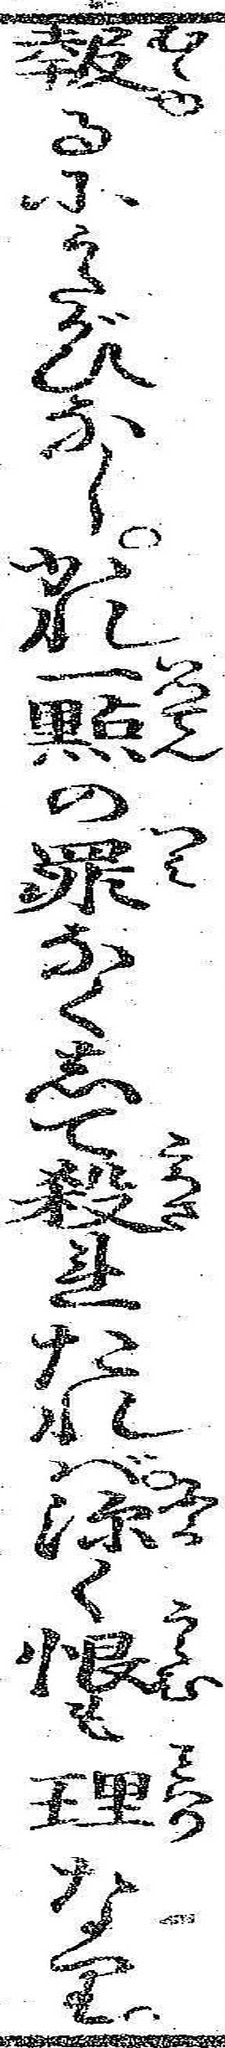報るにうたがひなし。かれ一点の罪なくして殺れたれば。深く恨も理なり。
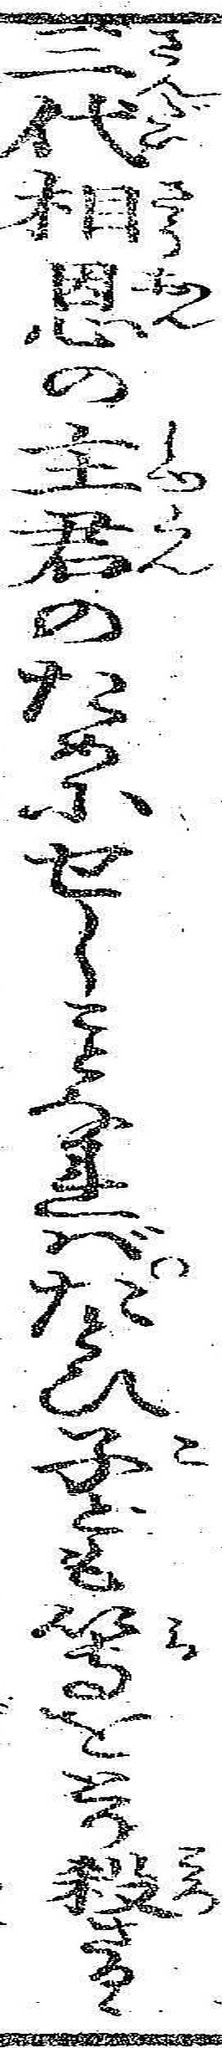三代相恩の主君のためにせしことなれば。たとひ子ども等をとり殺さるゝ
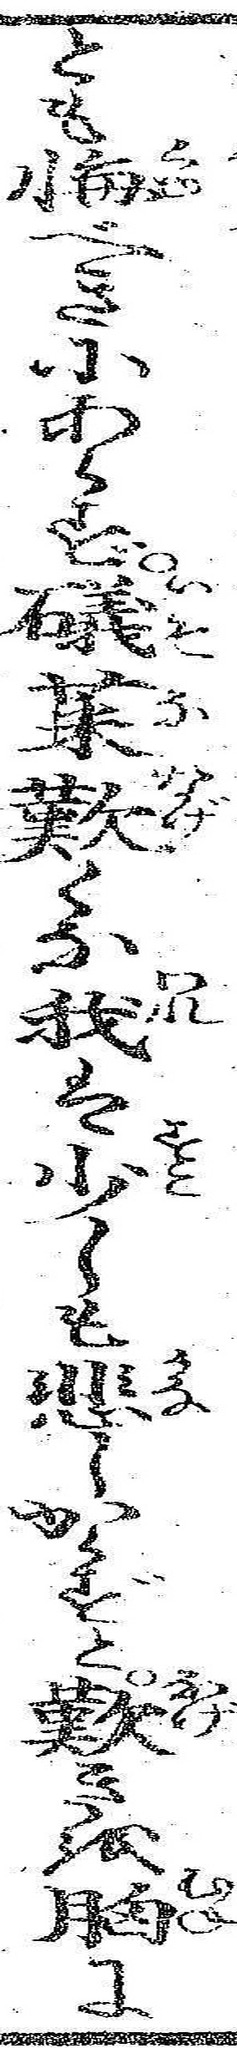とも悔べきにあらず。礒菜歎くな我は少しも悲しからずと。歎きを胸に
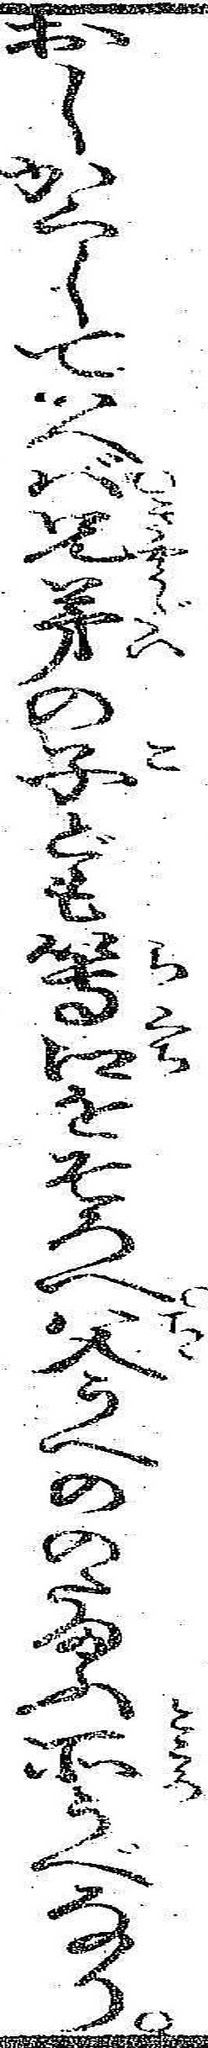おしかくしていへば。兄弟の子ども等口をそろへ。父うへののたまふ所うべなり。
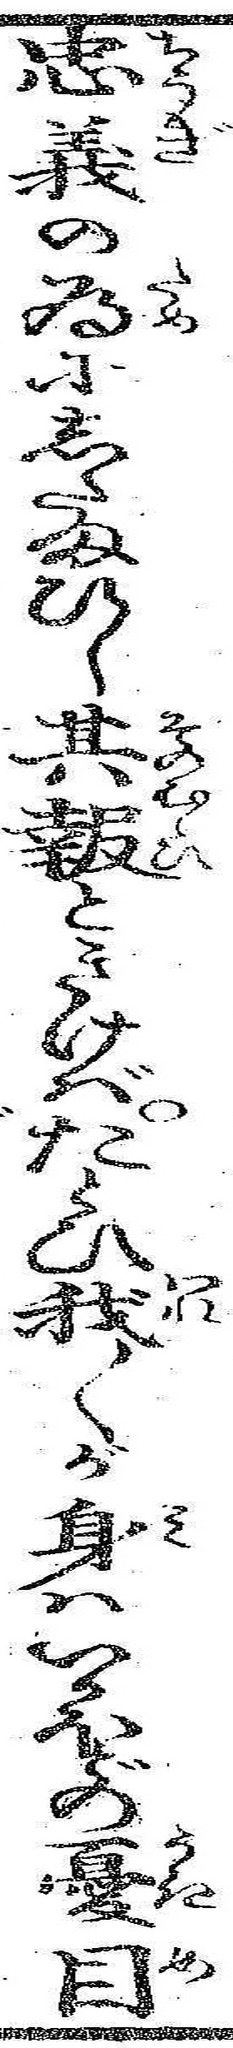忠義の為にしたまひし其報ときけば。たとひ我々が身はいかほどの憂目
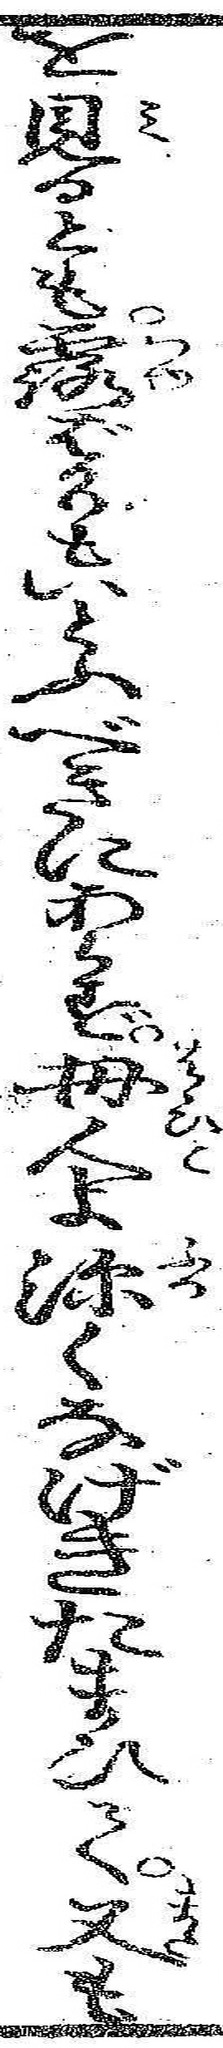を見るとも。露ばかりもいとふべきにあらず。母人よ深くなげきたまひて。又も
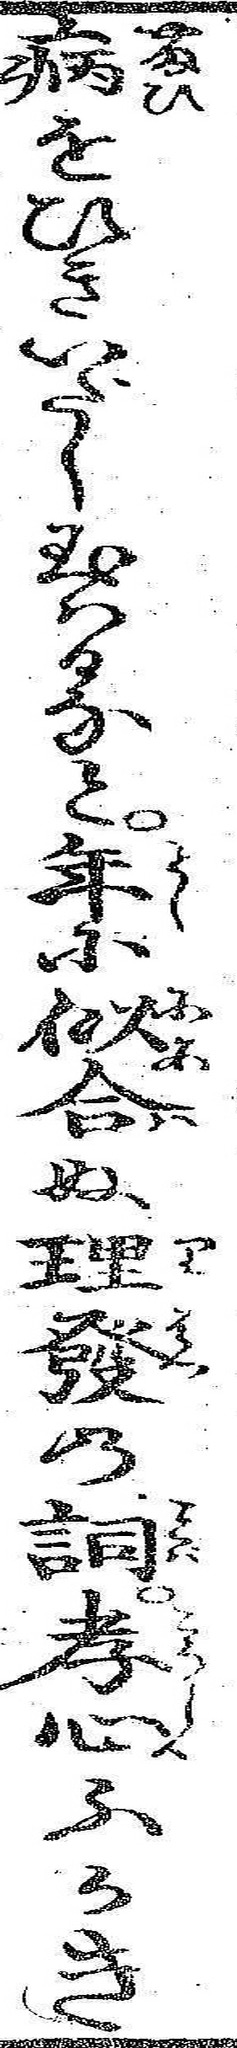病をひきいだし玉はるなと。年に似合ぬ理発の詞。孝心ふかき
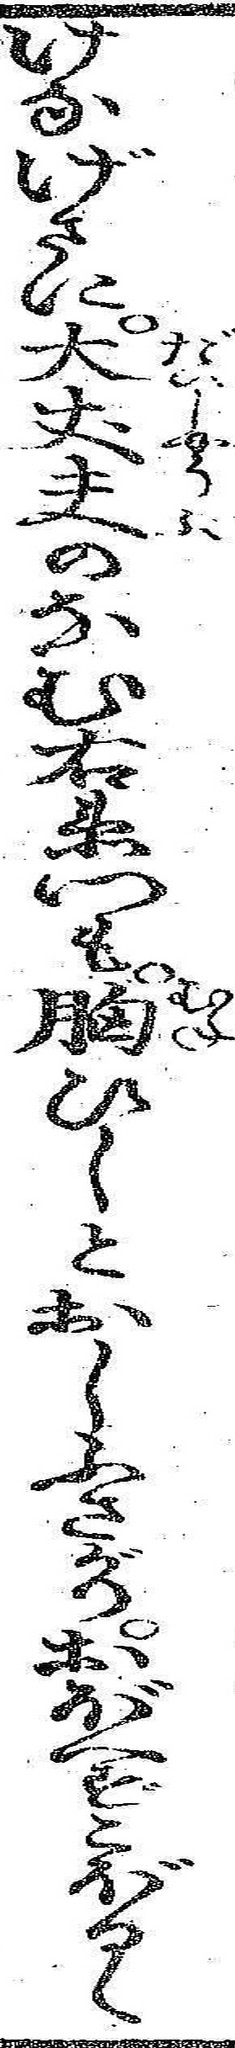けなげさに。大丈夫のなむ右衛門も。胸ひしとおしふさがり。おぼへずこぼるゝ
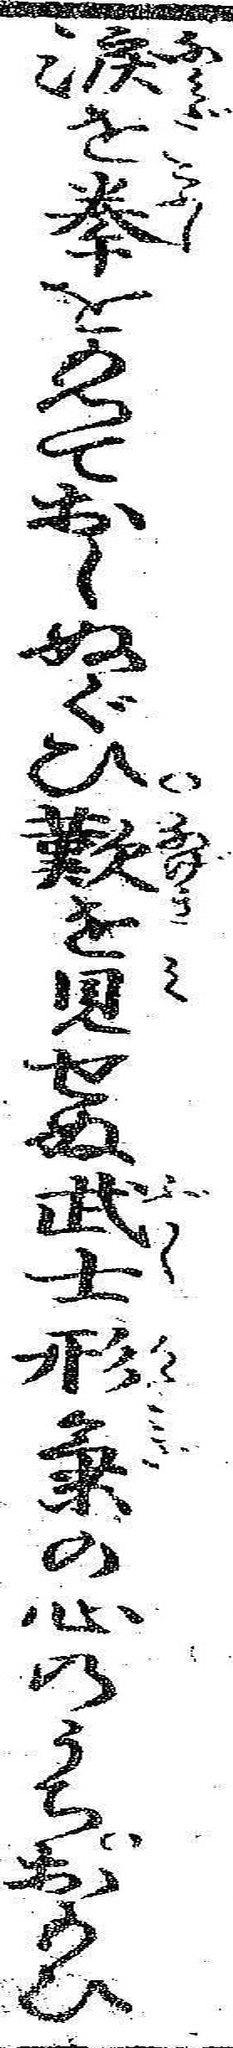涙を拳をもつておしぬぐひ。歎を見せぬ武士形気の心のうち。おもひ
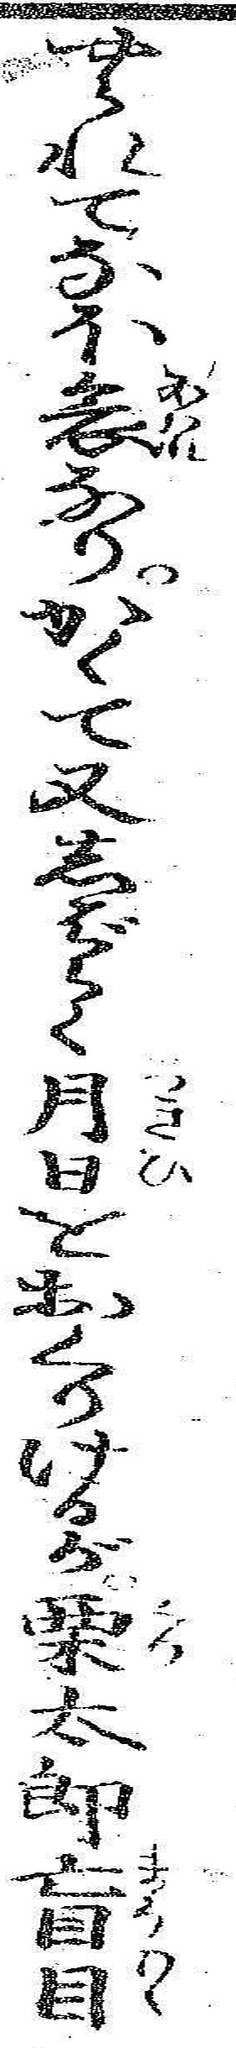やられてなほ哀なり。かくて又しばらく月日をおくりけるが。栗太郎盲目
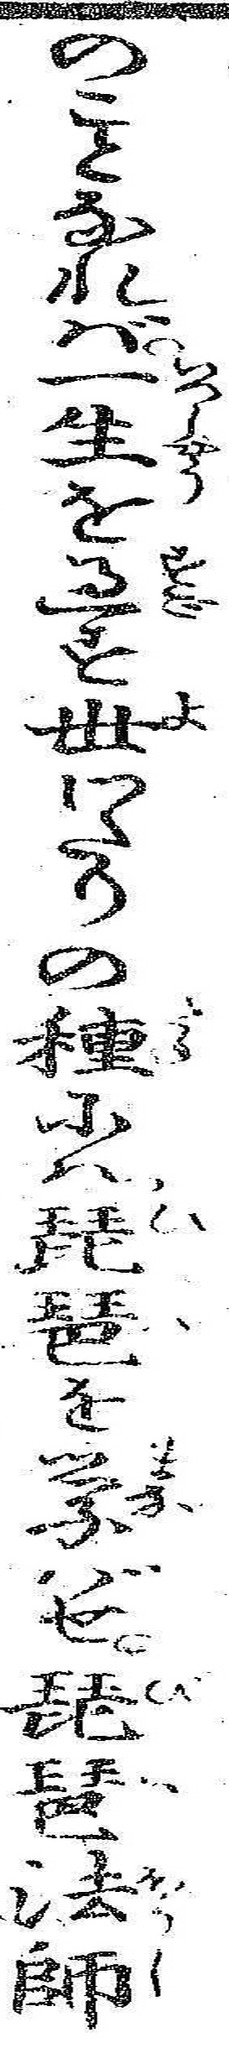のことなれば。一生を過す世わたりの種には。琵琶を学ばせ。琵琶法師
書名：昔話稲妻表紙
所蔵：国文学研究資料館
